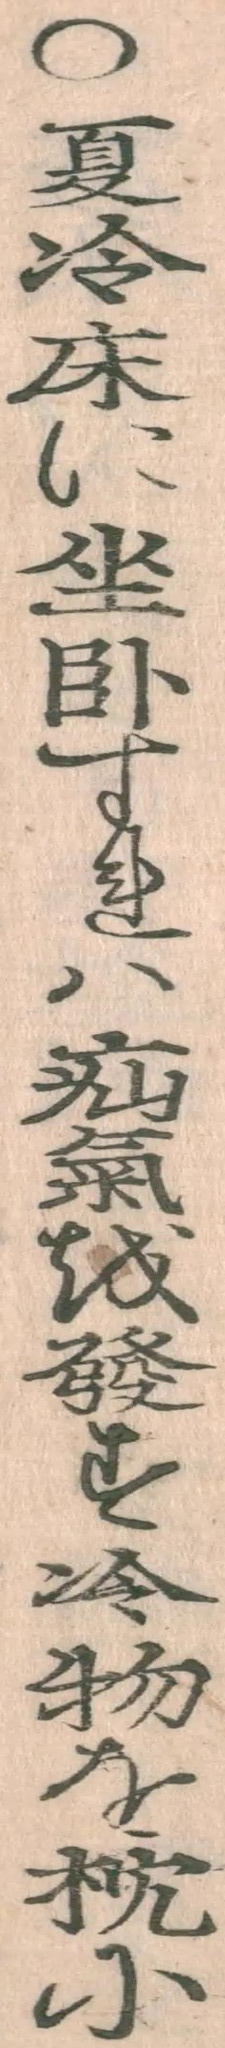〇夏冷床に坐臥すれは疝気を発す冷物を枕に
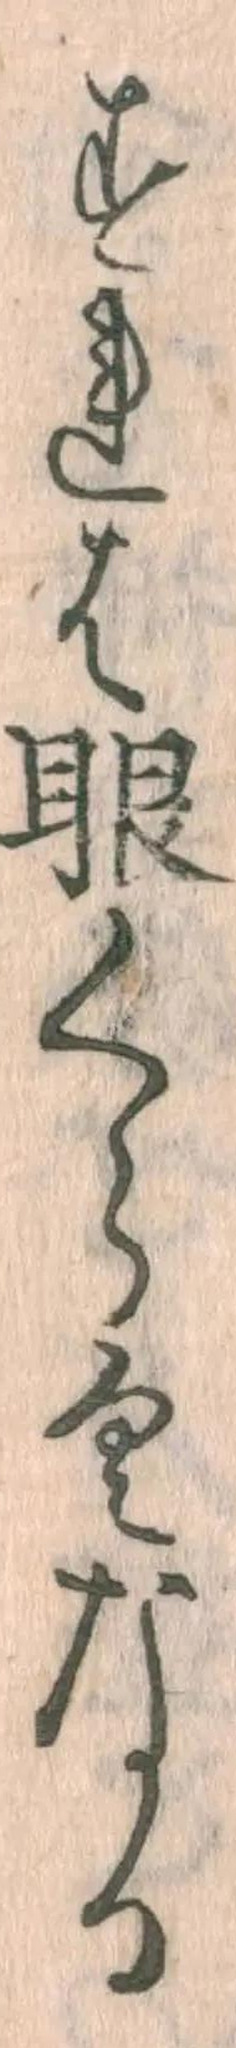すれは眼くらくなる
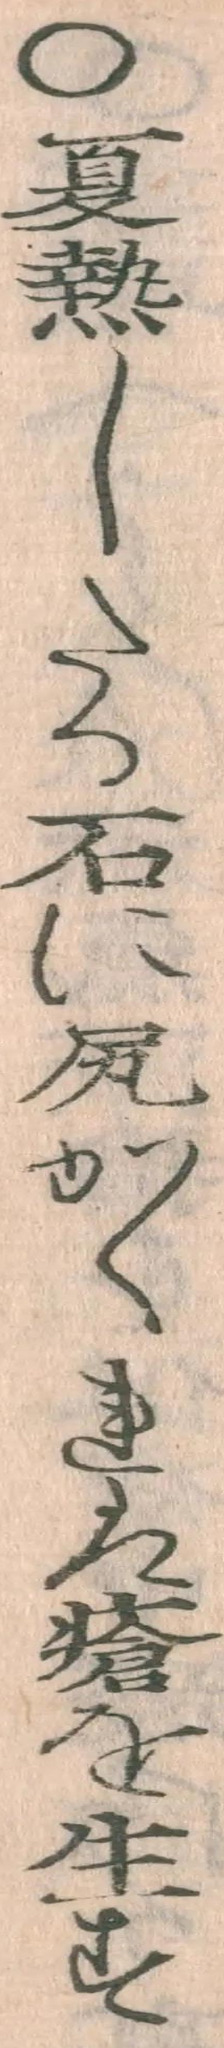〇夏熱したる石に尻かくれは瘡を生す
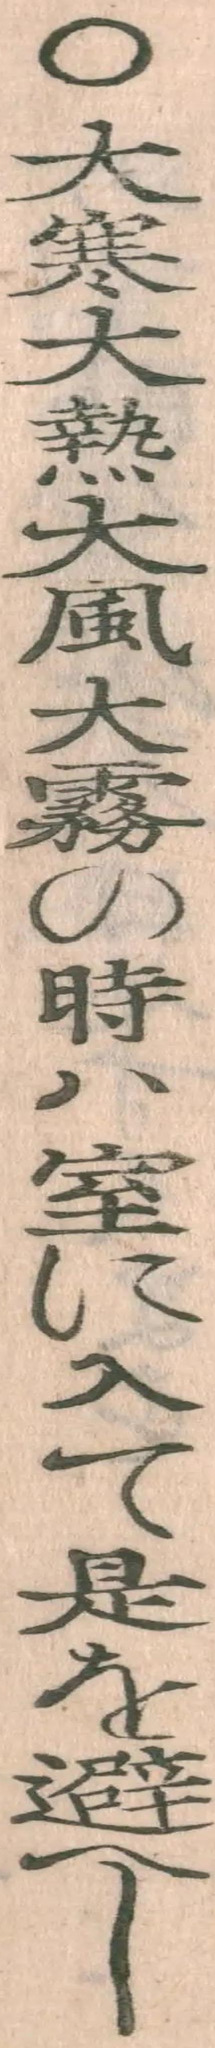〇大寒大熱大風大霧の時は室に入て是を避へし
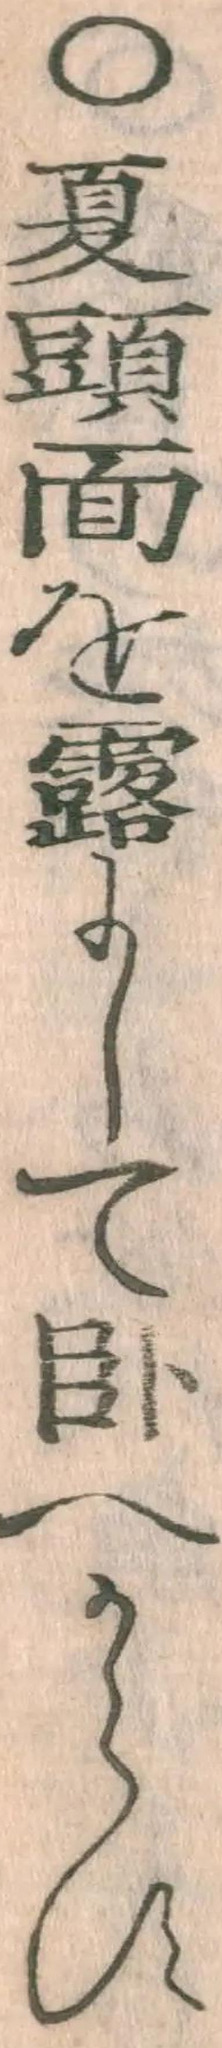〇夏頭面を露にして臥へからす
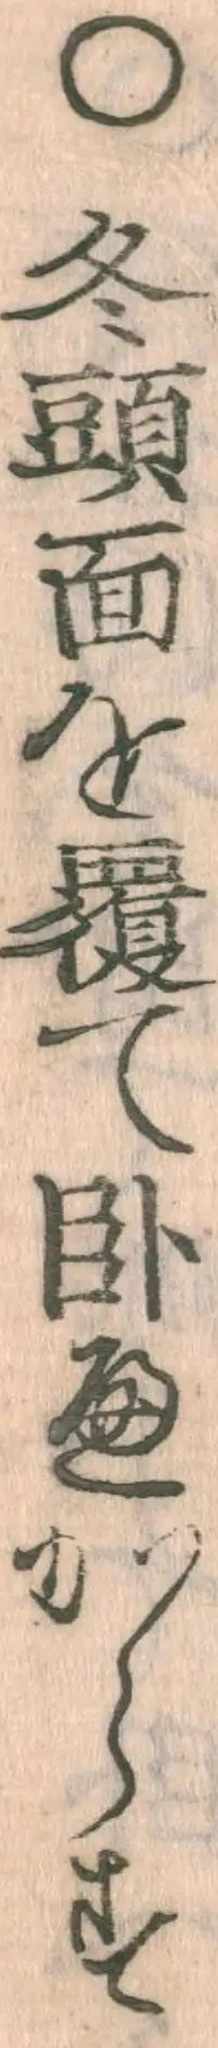〇冬頭面を覆て附へからす
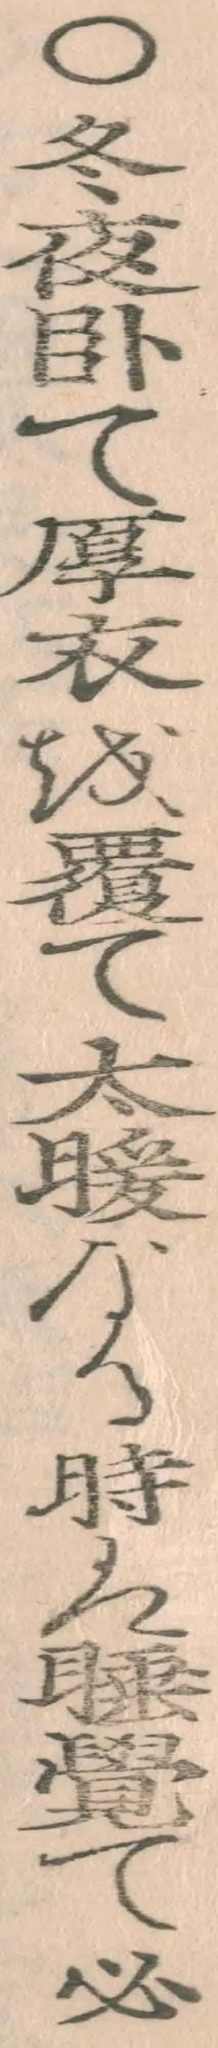〇冬夜臥て厚衣を覆て太暖なる時は睡覚て必
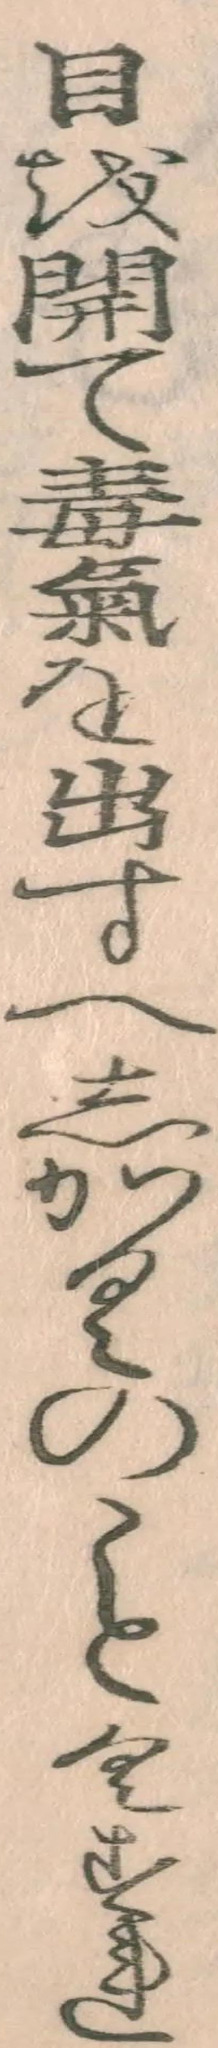目を開て毒気を出すへしかくのことくすれ
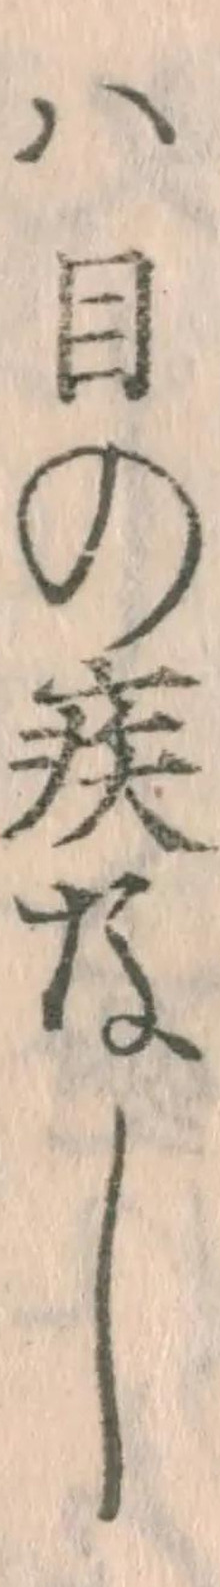は目の疾なし
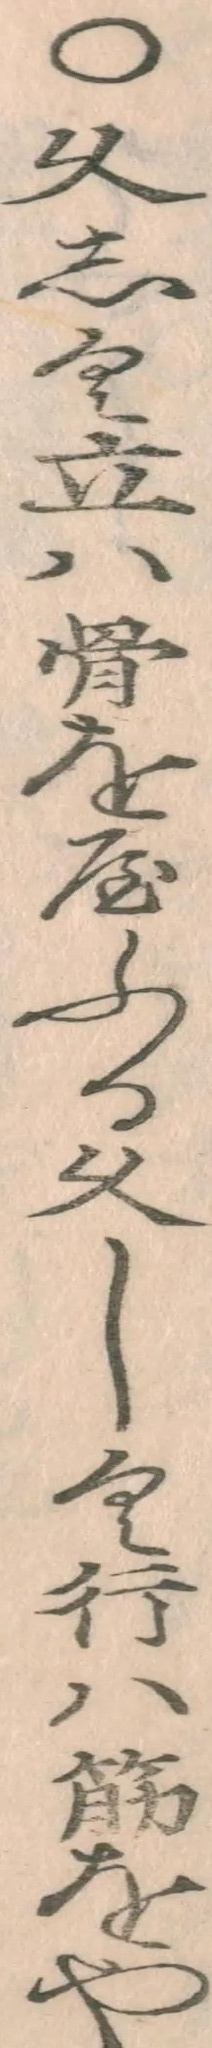〇久しく立は骨をやふる久しく行は筋をや
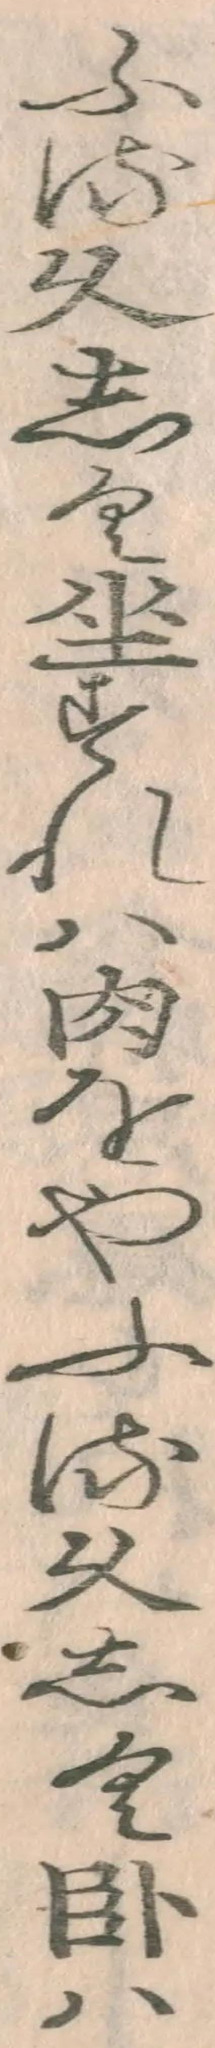ふる久しく坐すれは肉をやふる久しく臥は
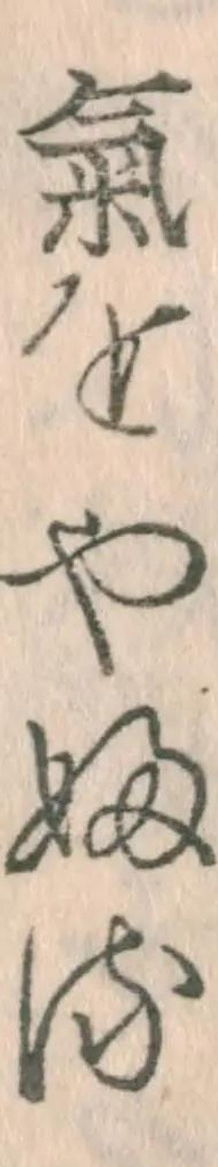気をやふる
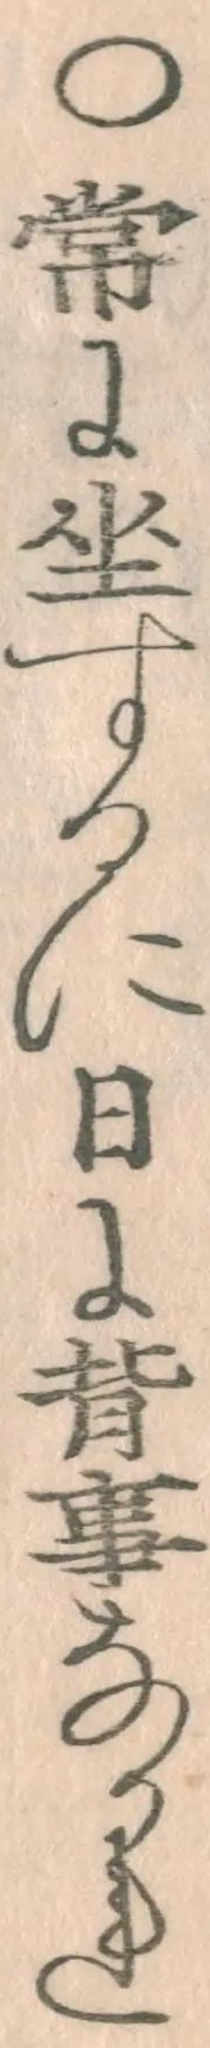〇常に坐するに日に背事なかれ
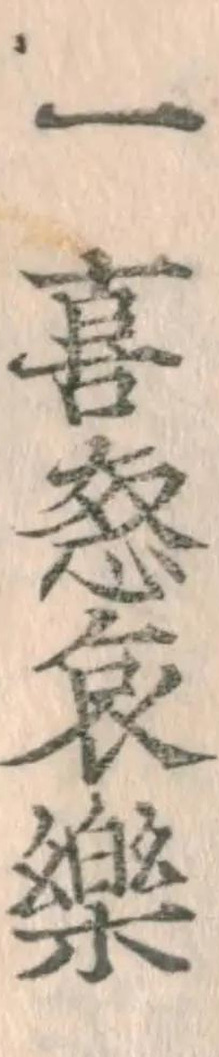一喜怒哀楽
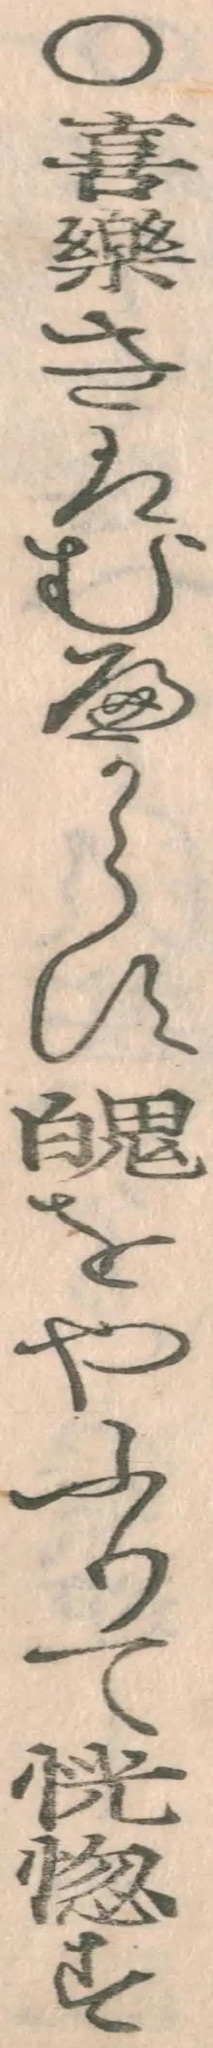〇喜楽きはむへからす魄をやふりて恍惚す

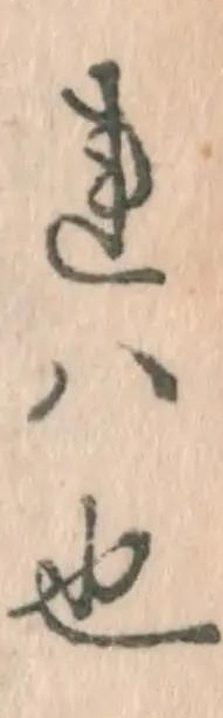れは也
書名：延壽撮要
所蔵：国立国会図書館 National Diet Library, JAPAN
